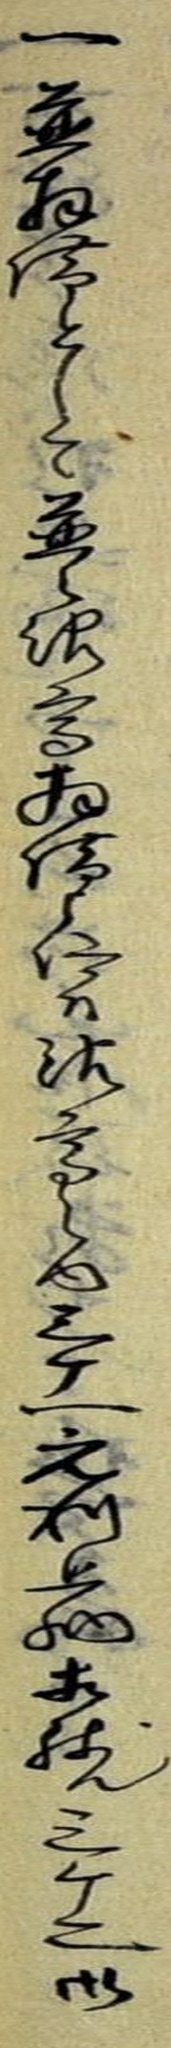一並拝借として並之銀高拝借被仰付銀高之内三ケ一元利上納相残ル三ケ二御
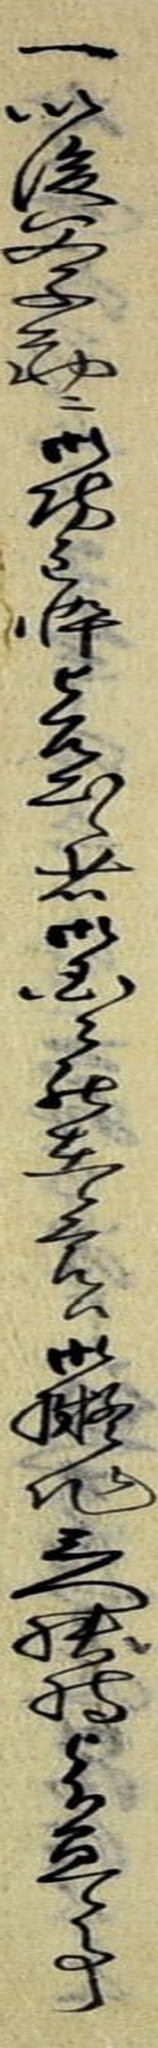一以後父子勤ニ御坊主忰被召出候者御国ニ罷在候節ハ御擬作三人扶持被下置候事
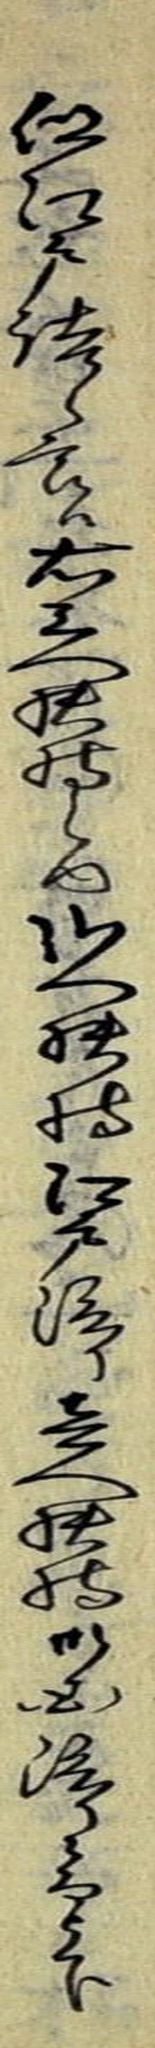但江戸詰之節ハ右三人扶持之内弐人扶持江戸渡り壱人扶持御国渡りニ而被下
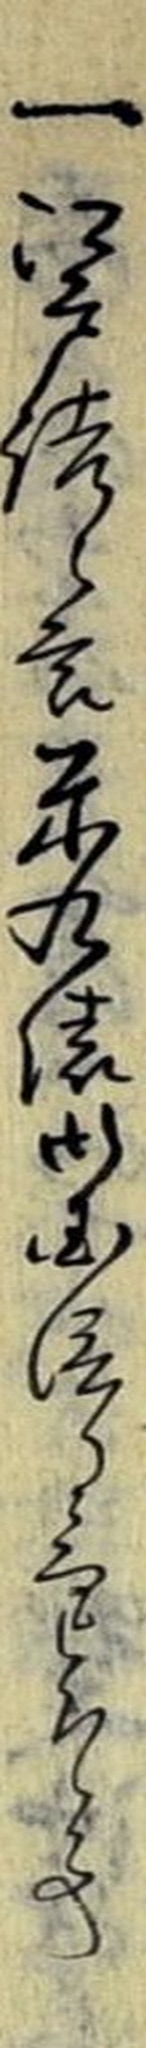一江戸詰之節米九俵御国渡りニ而被下候事
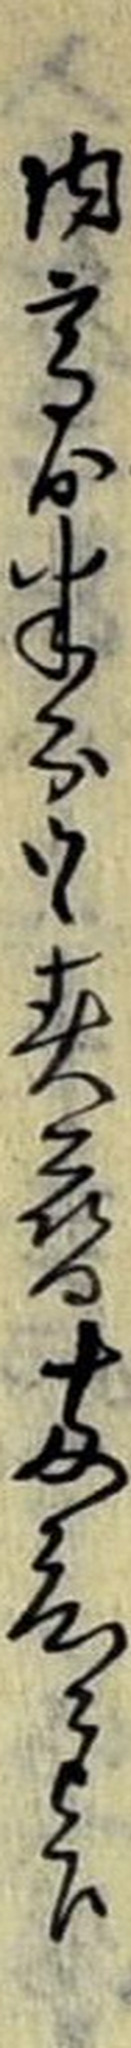内高ゟ半分ツヽ春暮両度ニ被下
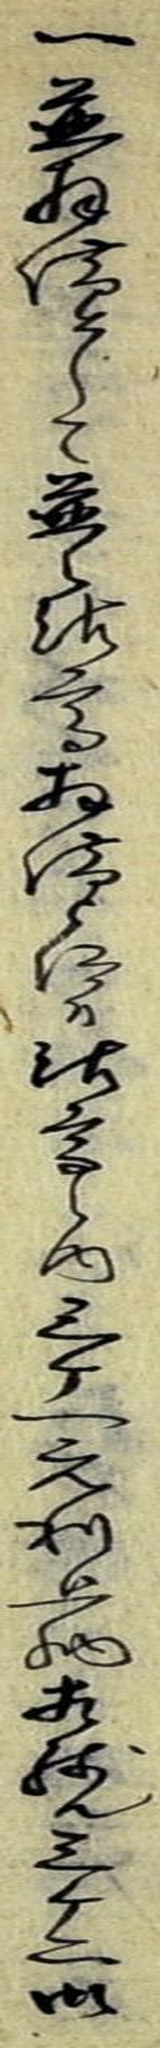一並拝借として並之銀高拝借被仰付銀高之内三ケ一元利上納相残ル三ケ二御
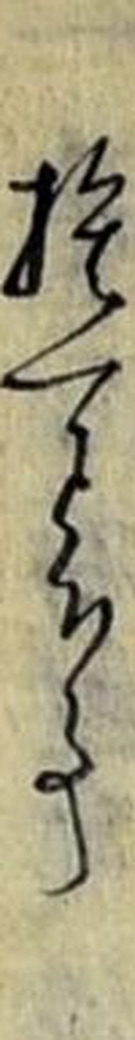捨可被下事
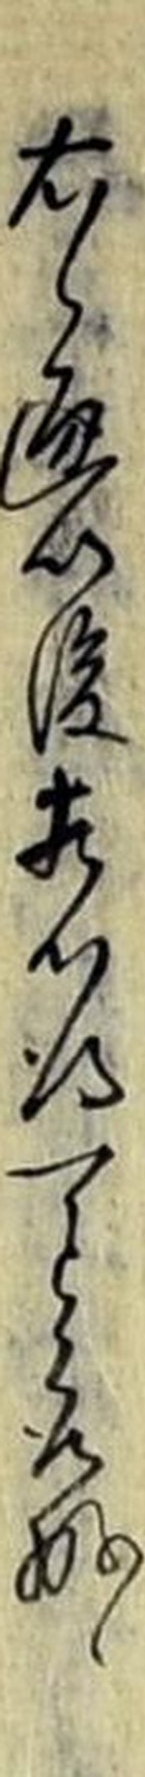右之通以後相心得可被取扱候
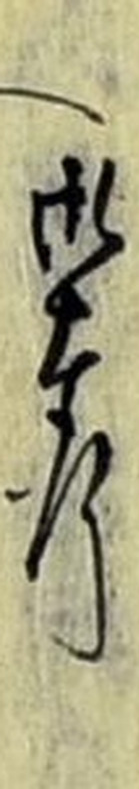御奉行
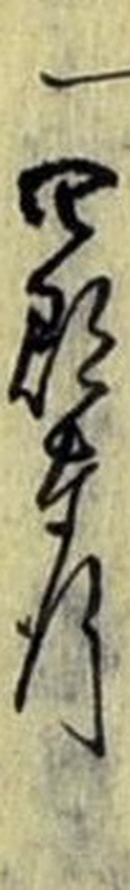四郡奉行
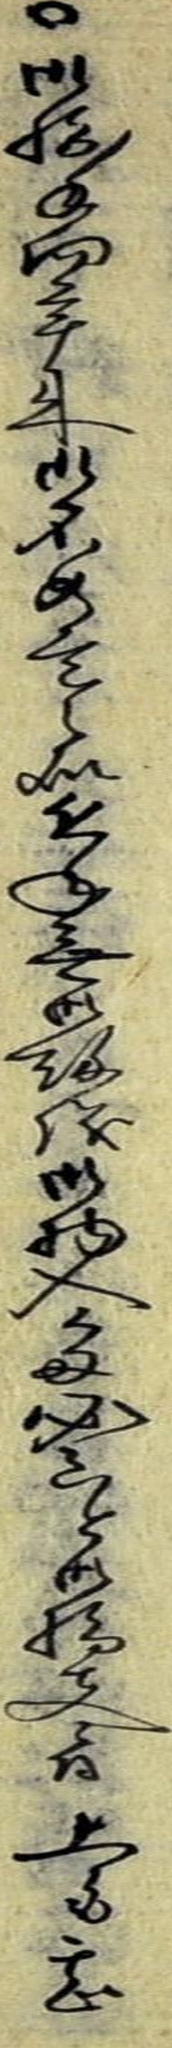〇御勝手向年来御不如意之処近年無御余儀御物入多必至と御指支ニ付上々も甚
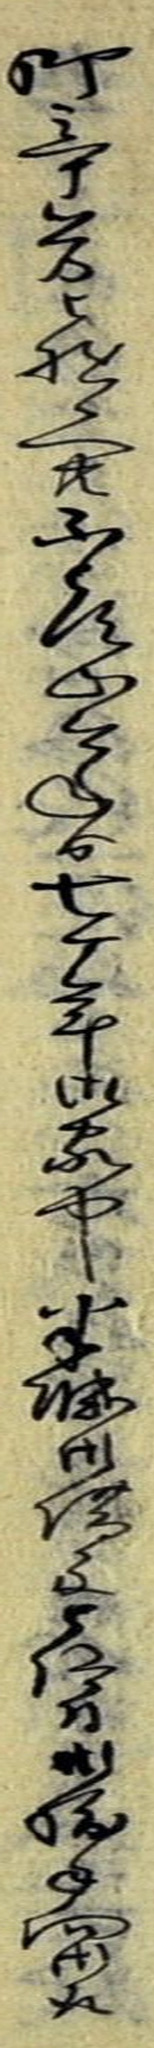御辛労被遊候へ共不被得止今年ゟ七ケ年御家中半減御借米被仰付御勝手向御取

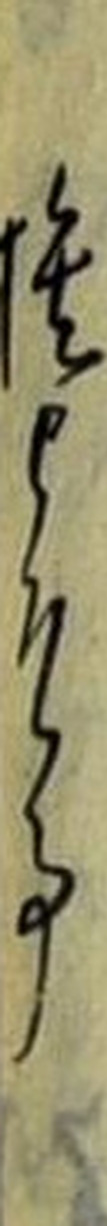捨被下候事
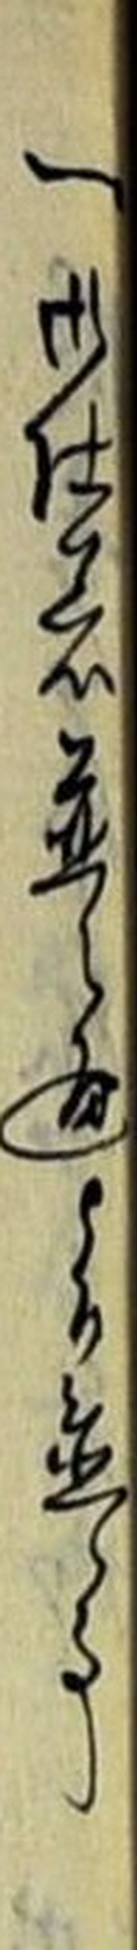一御仕着並之通被下置候事
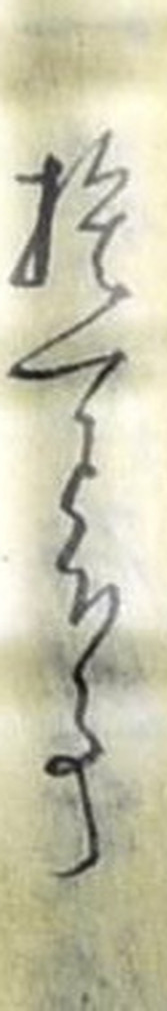捨被下候事

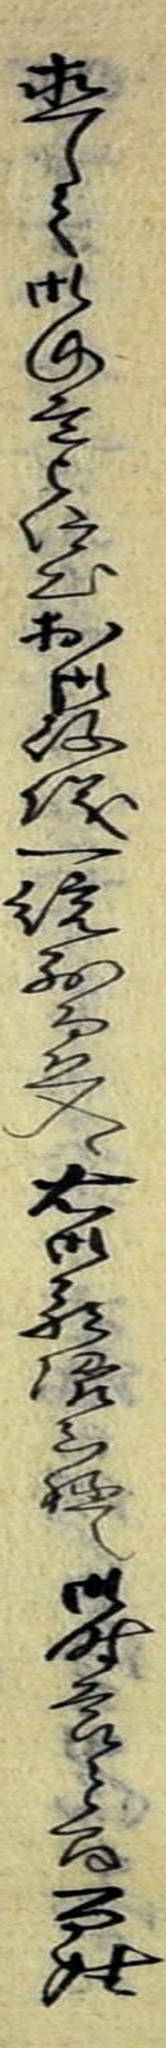直し之御趣意被仰出於御役儀一統別而恐入候右御難渋至極之御時節ニ候間百姓
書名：命令之部 三
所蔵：福井県文書館 Fukui Prefectural Archives
